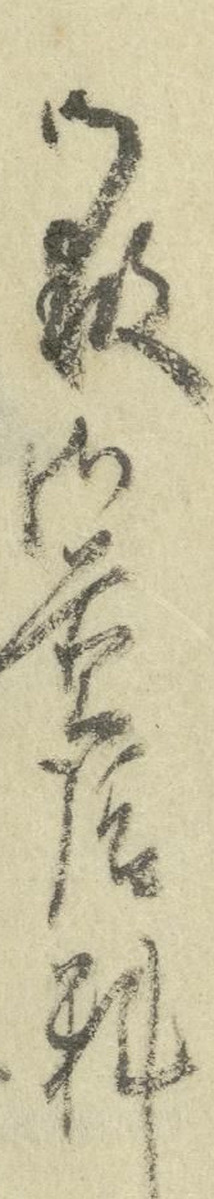御救御普請料
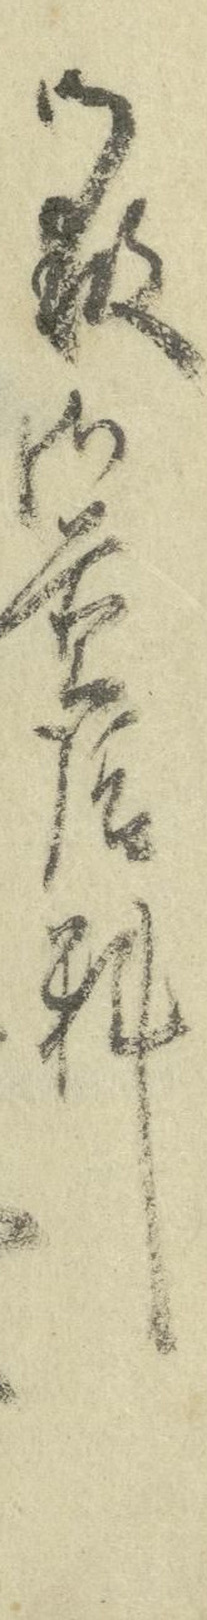御救御普請料
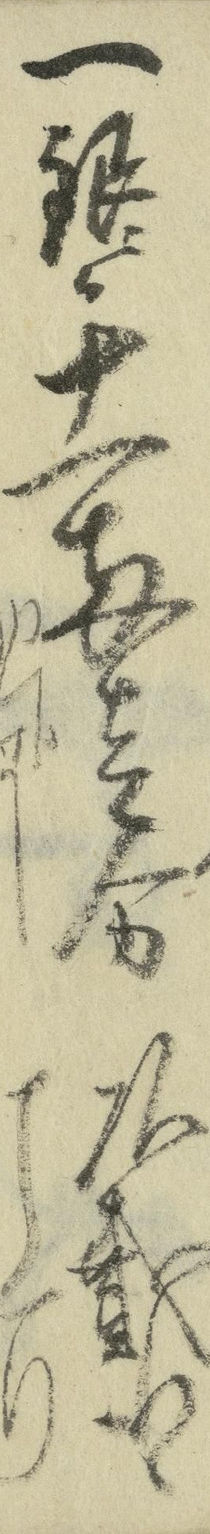一銀二而十一両壱分頂戴分
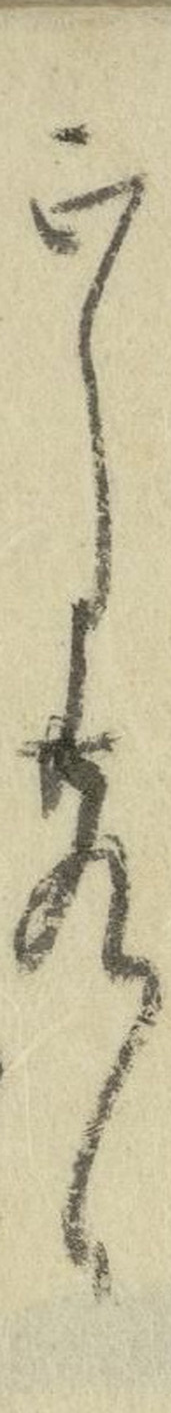正月廿九日
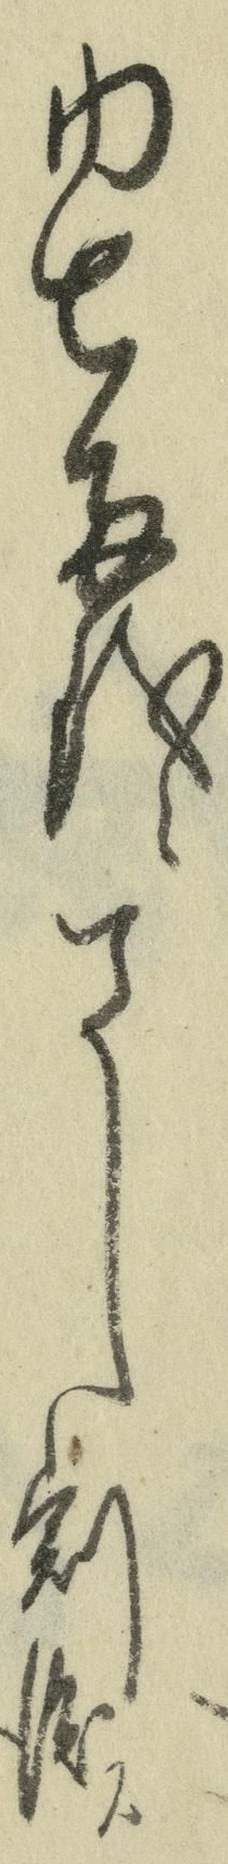内七両銭にて？割渡ス
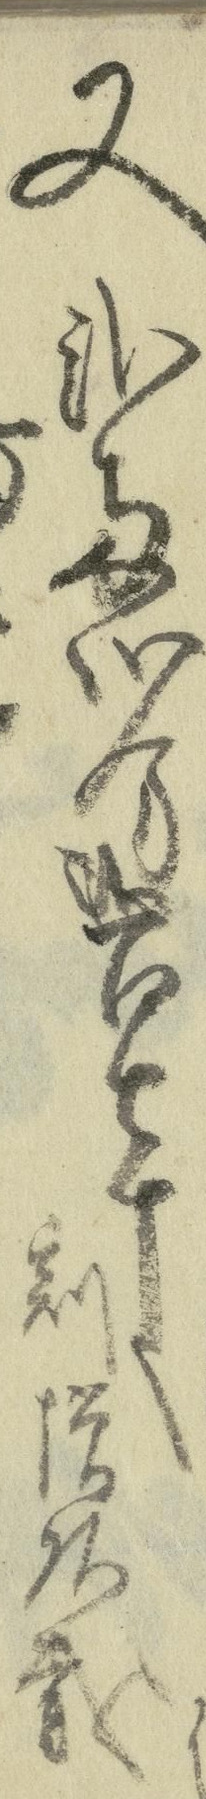又弐両弐分弐百七十文にて？
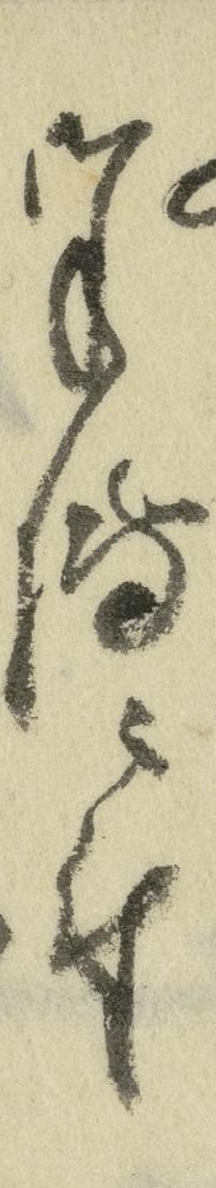御手伝二付
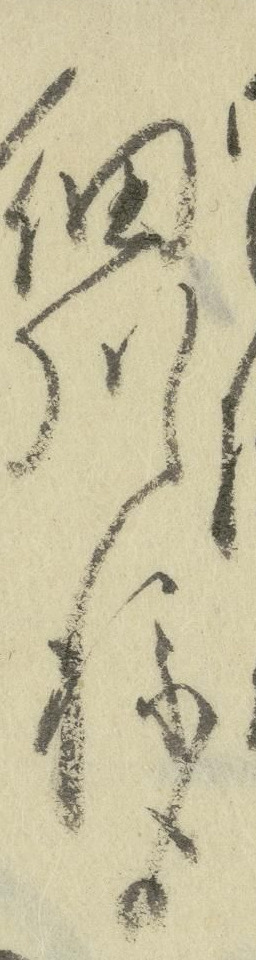細川様ゟ
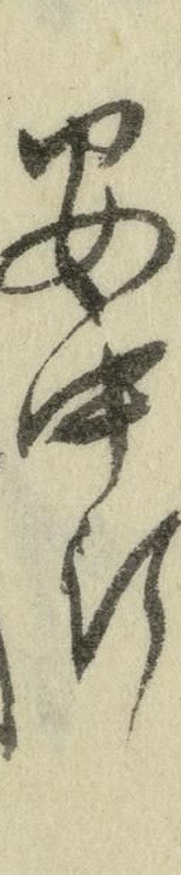安中行
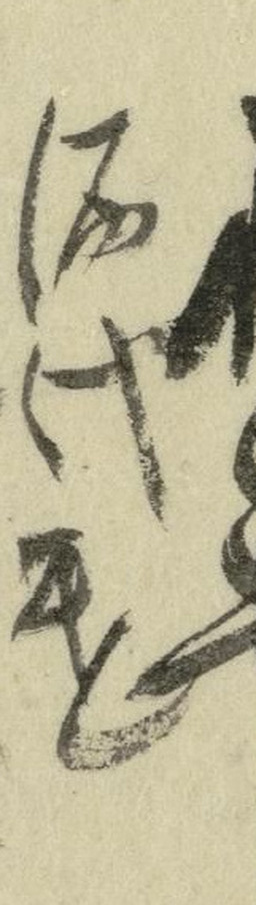酒代遣
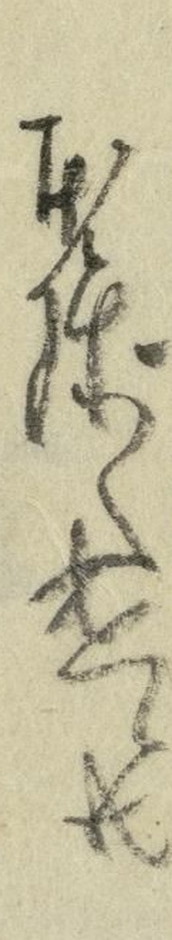本陣へ遣候共

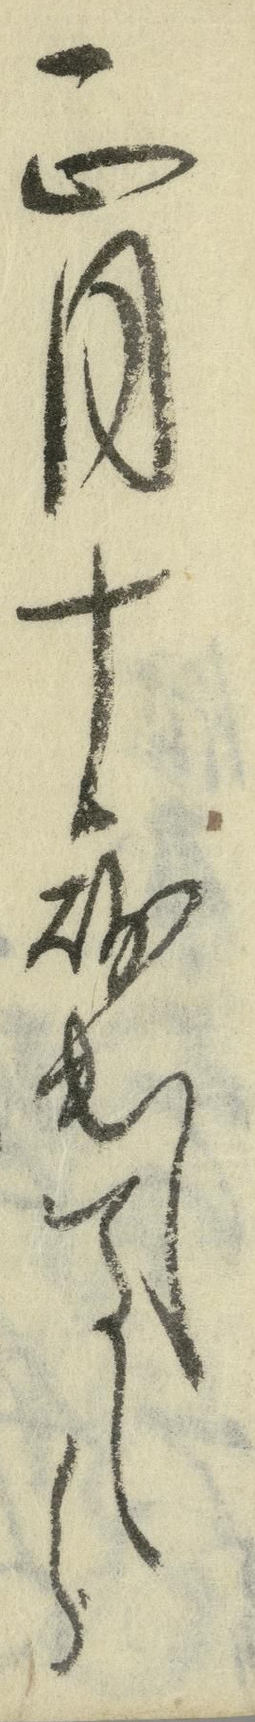正月十日砂出し可申候分
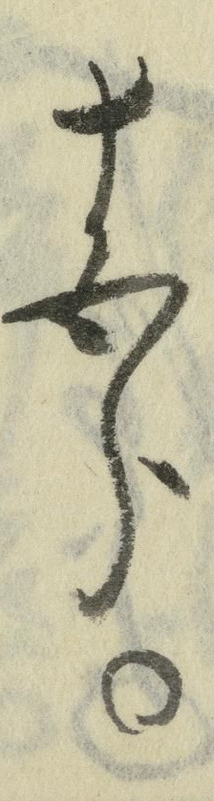十五郎
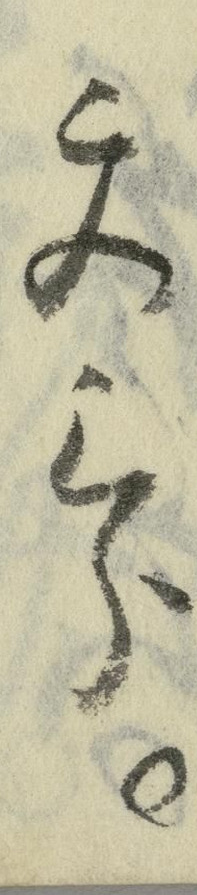文三郎
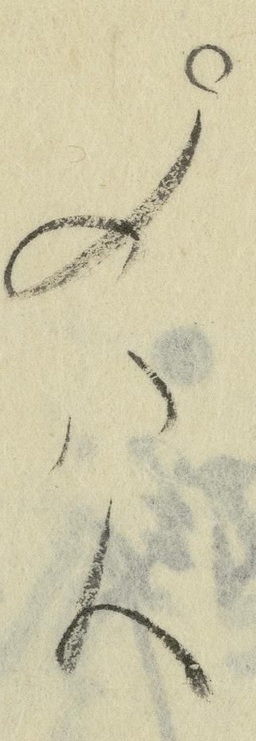〆八人
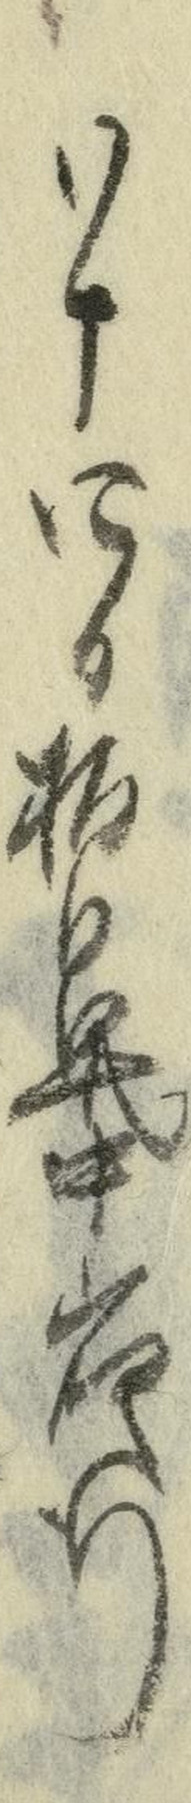同十四日板鼻中宿行
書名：天明淺間噴火ニ関スル書類
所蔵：東京大学地震研究所図書室 Earthquake Research Institute Library, The University of Tokyo, JAPAN
